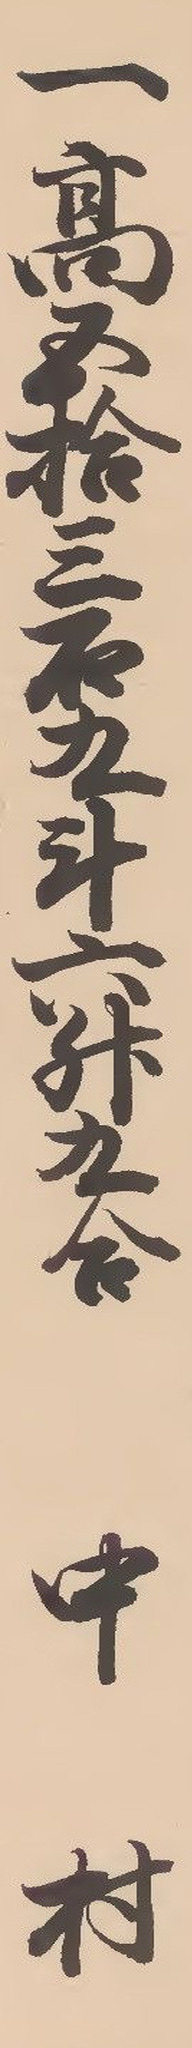一高五拾三石九斗六升九合中村
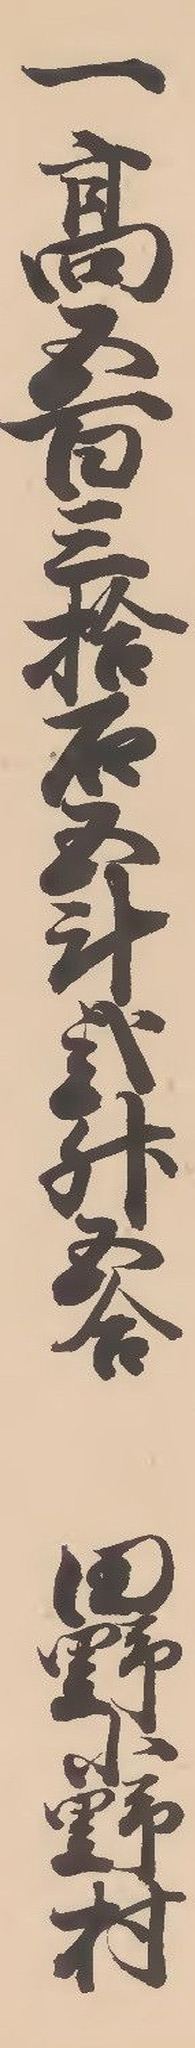一高五百三拾石五斗弐升五合田野小野村
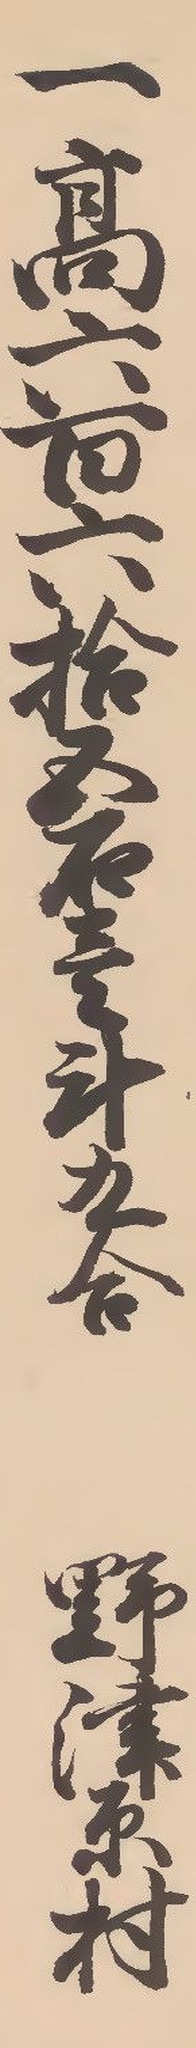一高六百六拾五石壱斗九合野津原村
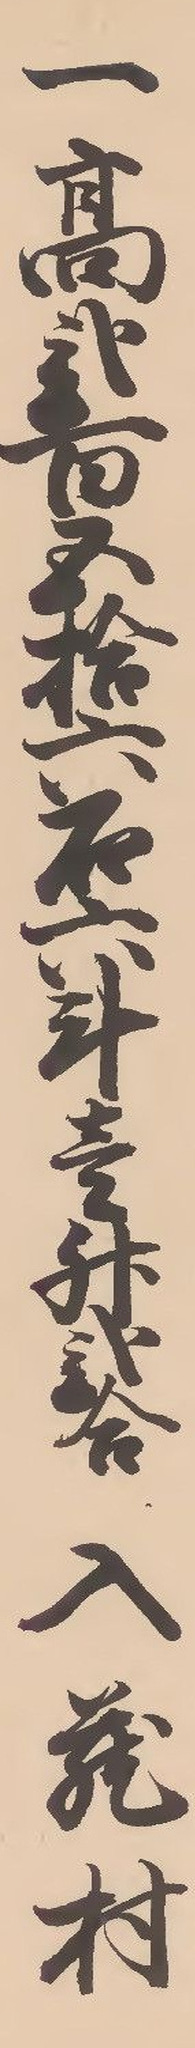一高弐百五拾六石六斗壱升弐合入蔵村

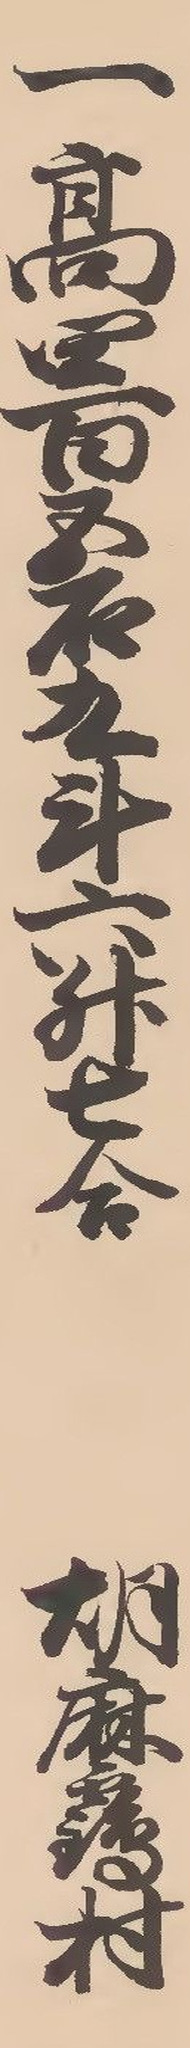一高四百五石九斗六升七合胡麻鶴村
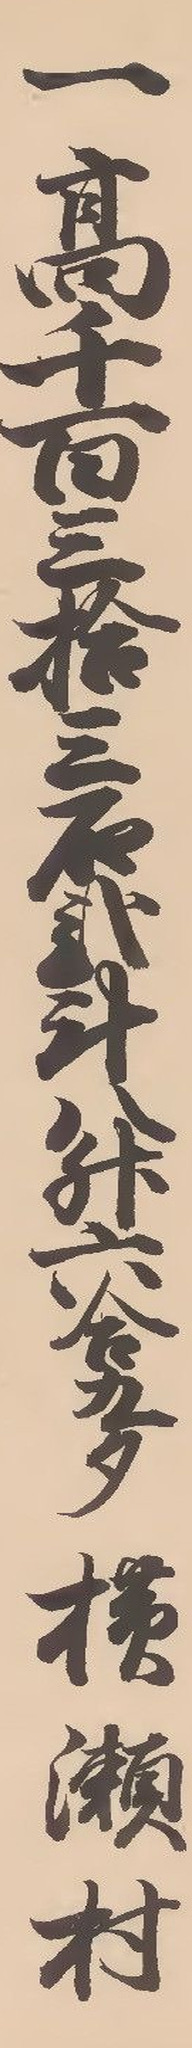一高千百三拾三石弐斗八升六合九勺横瀬村
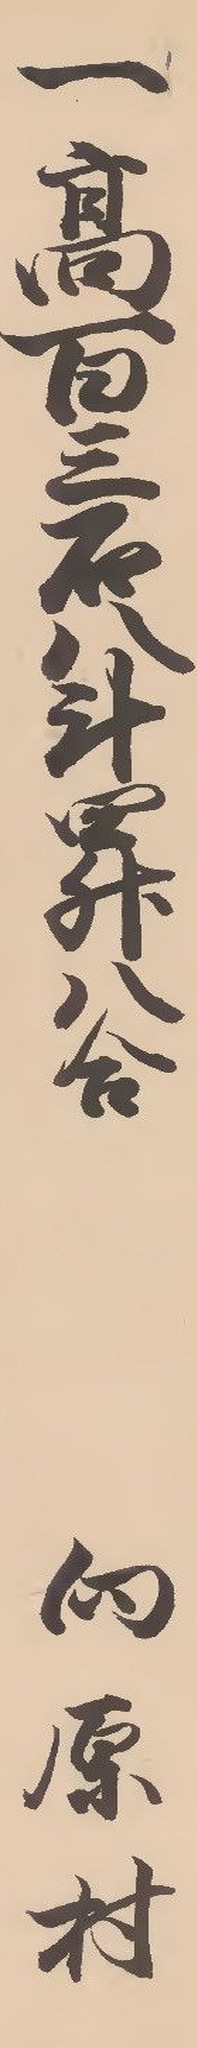一高百三石八斗四升八合向原村
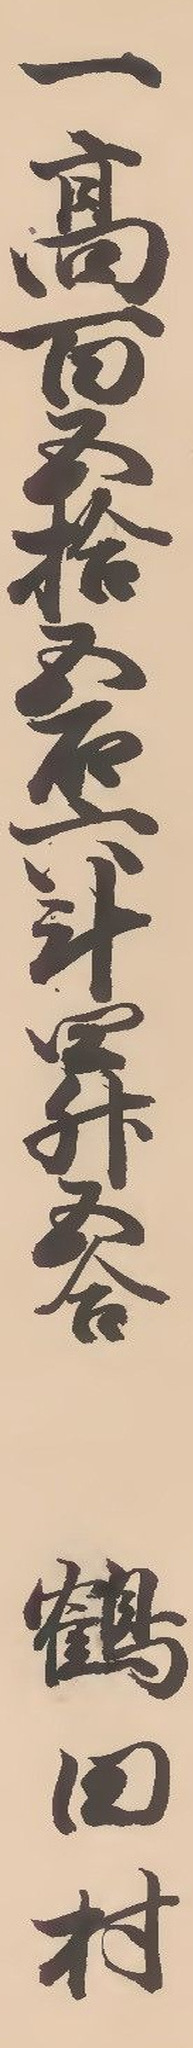一高百五拾五石六斗四升五合鶴田村
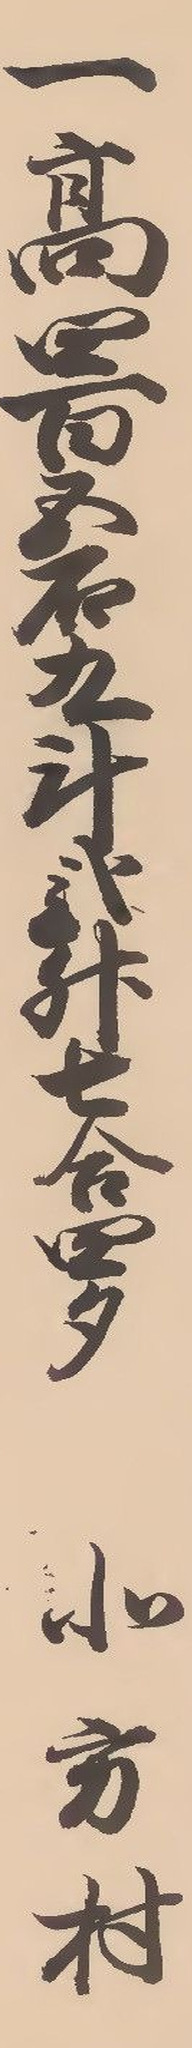一高四百五石九斗弐升七合四勺北方村
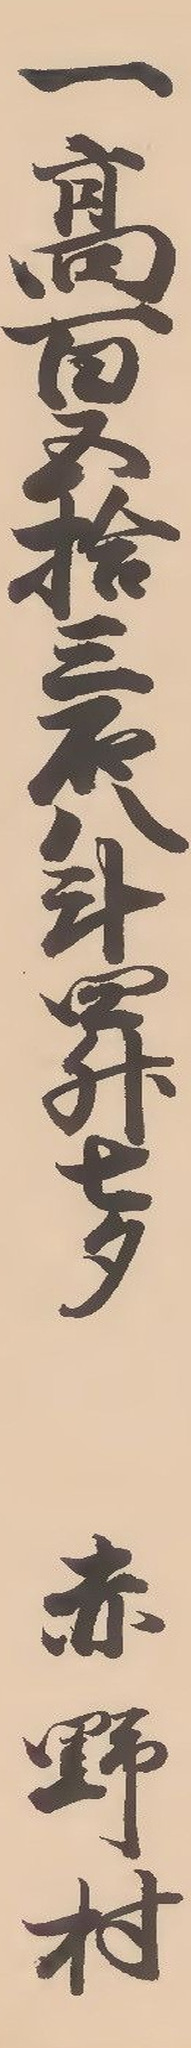一高百五拾三石八斗四升七勺赤野村
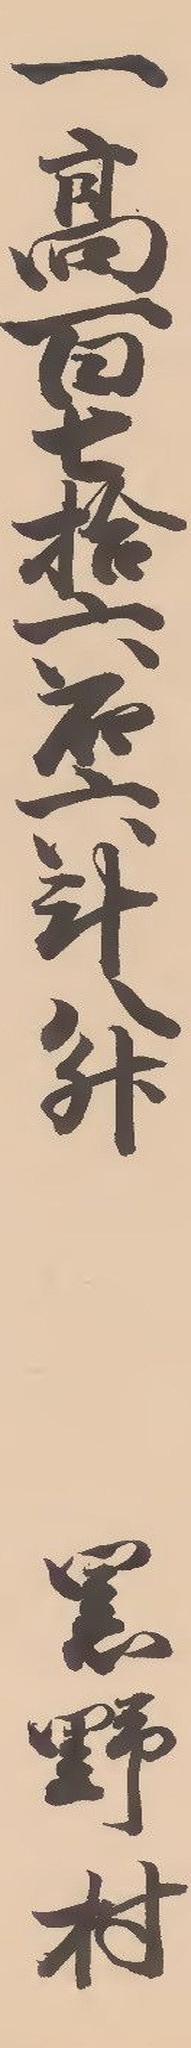一高百七拾六石六斗八升黒野村
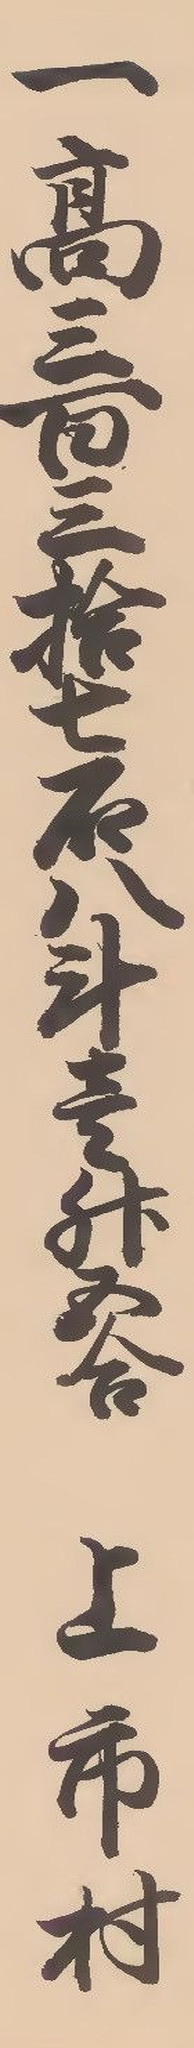一高三百三拾七石八斗壱升五合上市村

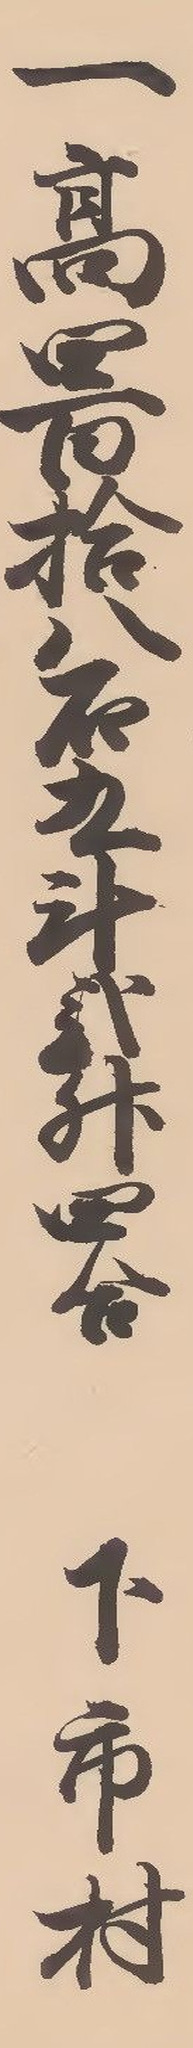一高四百拾八石九斗弐升四合下市村
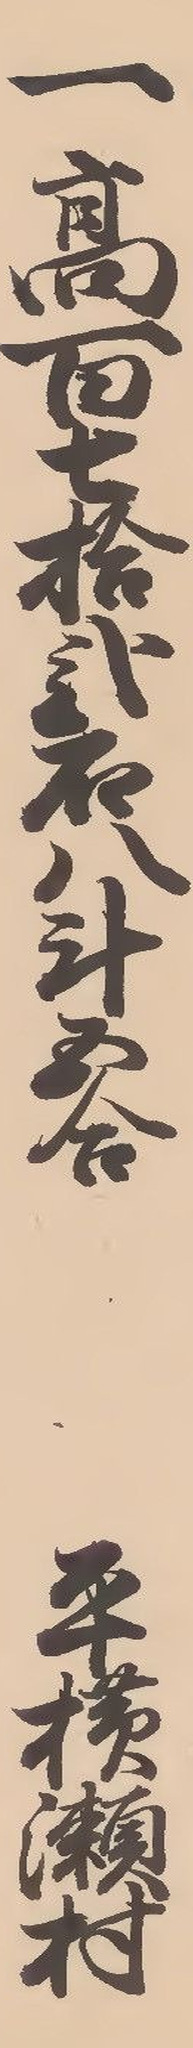一高百七拾弐石八斗五合平横瀬村
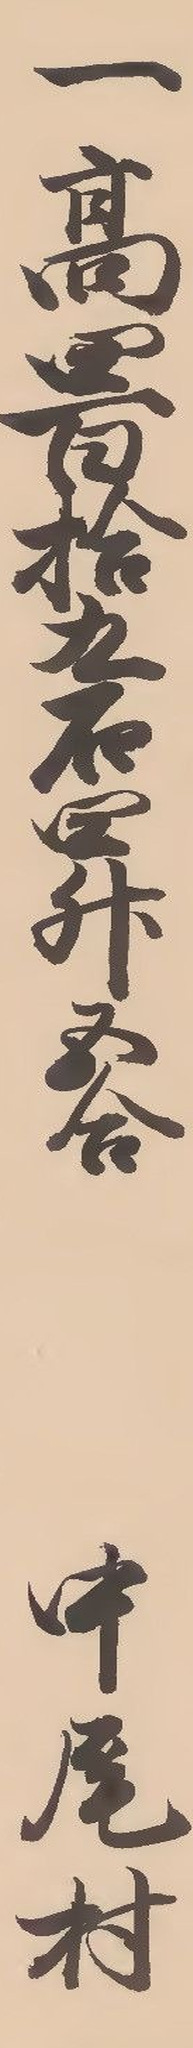一高四百拾九石四升五合中尾村
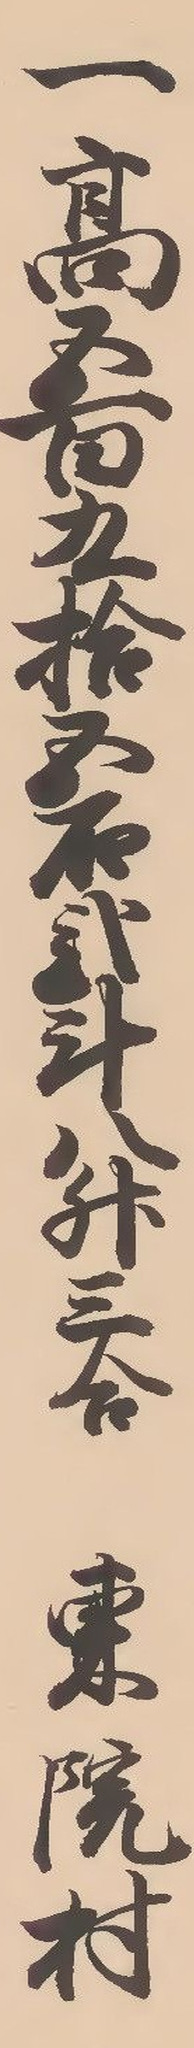一高五百九拾五石弐斗八升三合東院村
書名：豊後国郷帳
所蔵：国立公文書館 National Archives of Japan
